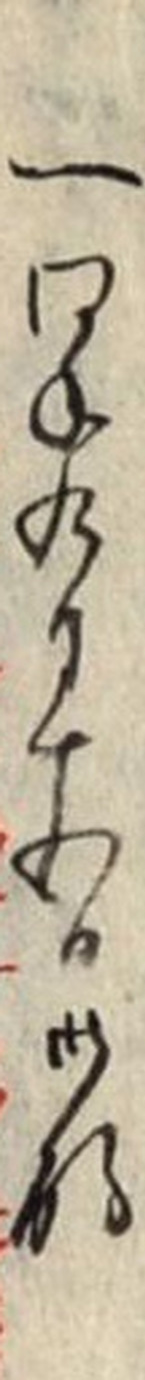一同年九月十五日御触
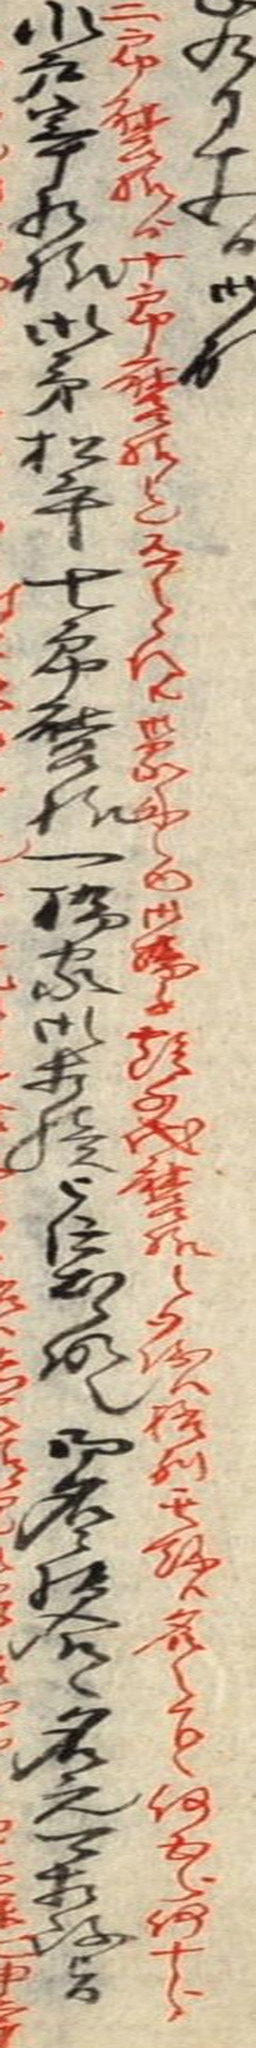水戸宰相様御弟松平七郎麿様一橋家御相続被仰出候仍之御名に指合候名元可相改旨
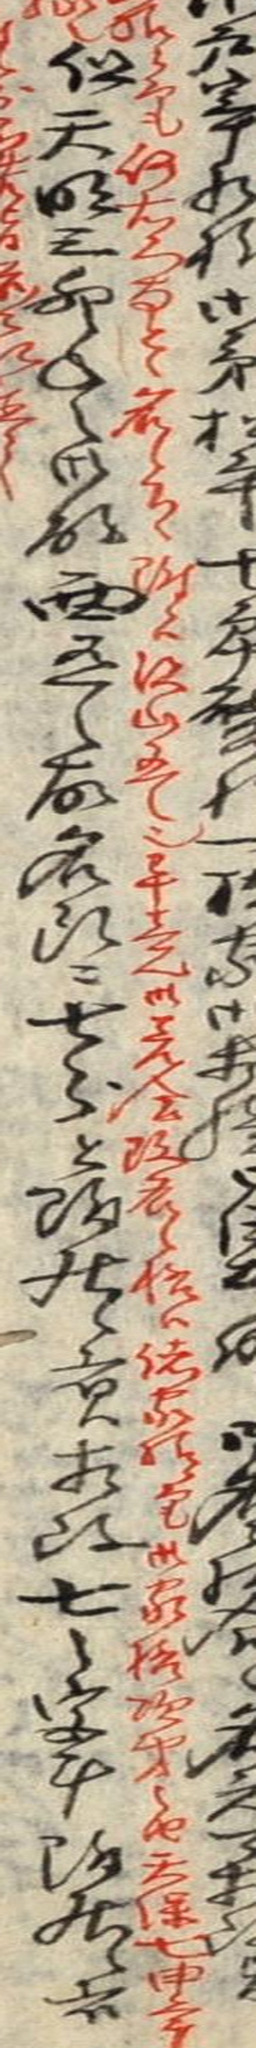但天明三卯年之御触留有之候故名頭に七郎と附居候者は相改七之字斗附居候者
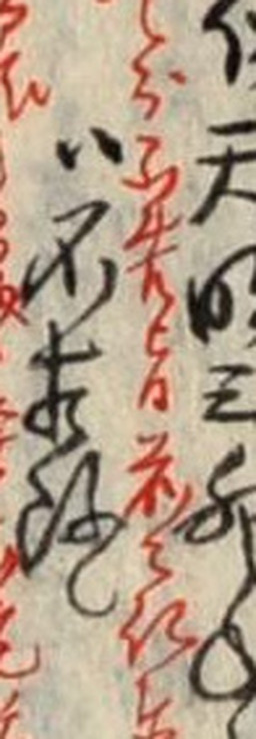は不相改候
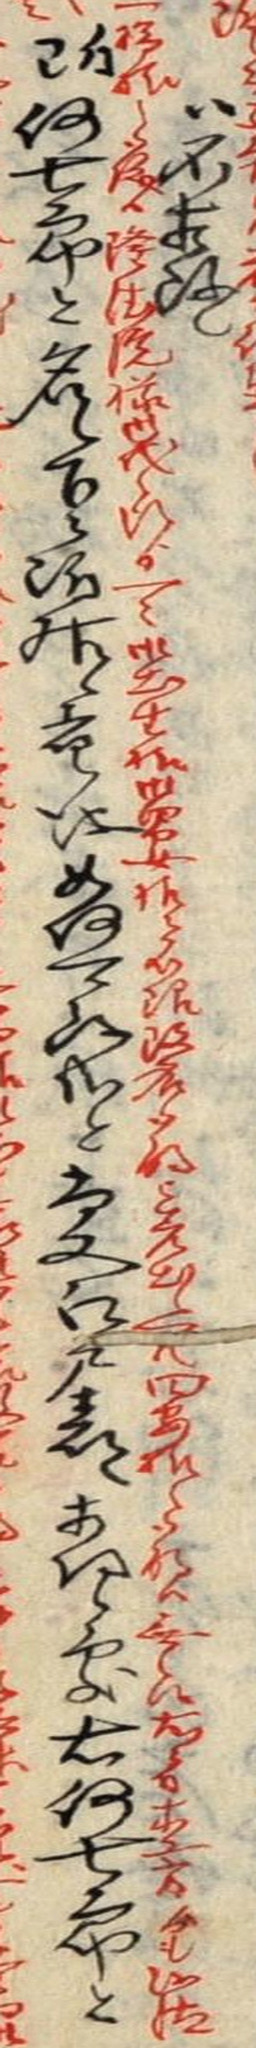附何七郎と名之下に附居候者之儀如何可致哉と尚又江戸表へ相伺候処右何七郎と

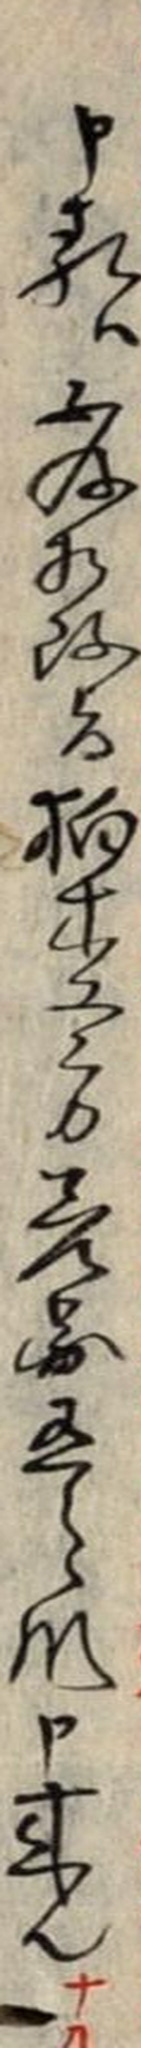申類は不及相改旨狛木工方差図有之候段申来る
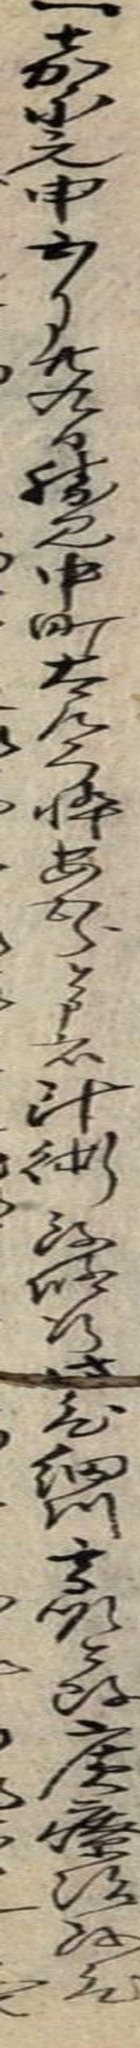一嘉永元申五月廿九日勝見中町太左衛門忰安五郎と申者針術致修行此度細川髙順と改広療治致度
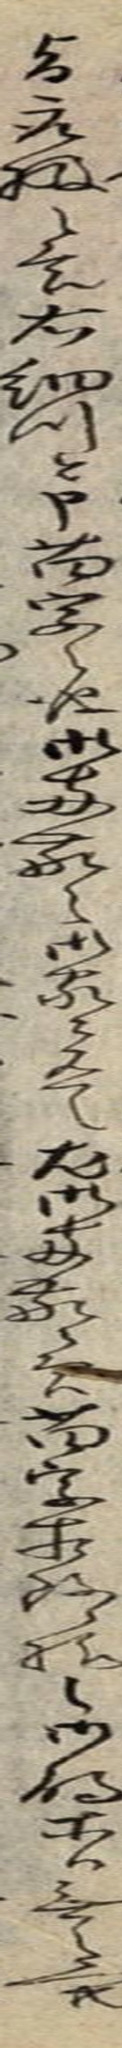旨取扱之節右細川と申苗字之儀御両家之御家に有之尤御両家に而は苗字相改候様之御触等は無之候へ共
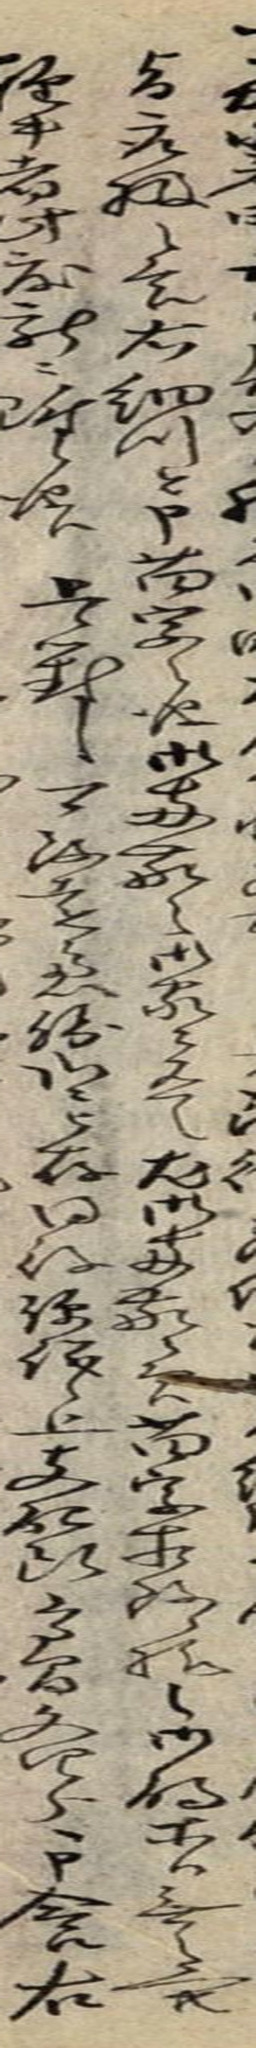軽き者此度新に附候儀は上に対し可被致遠慮儀哉に被存同役評議之上支配頭高間文四郎へ申合候右
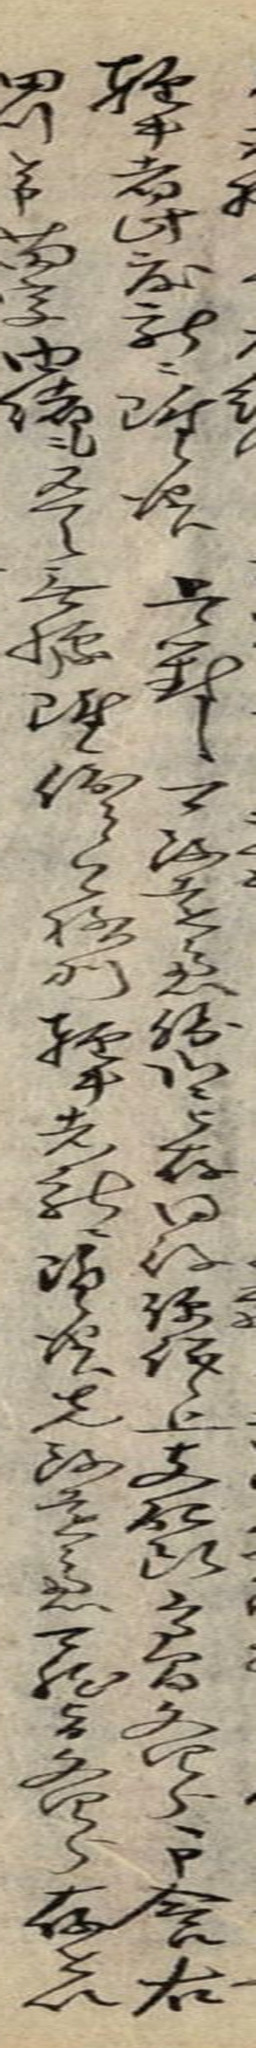細川と申苗字由緒も有之無拠附候儀に候はゝ格別軽き者新に附候儀は先致遠慮可然旨文四郎存を以
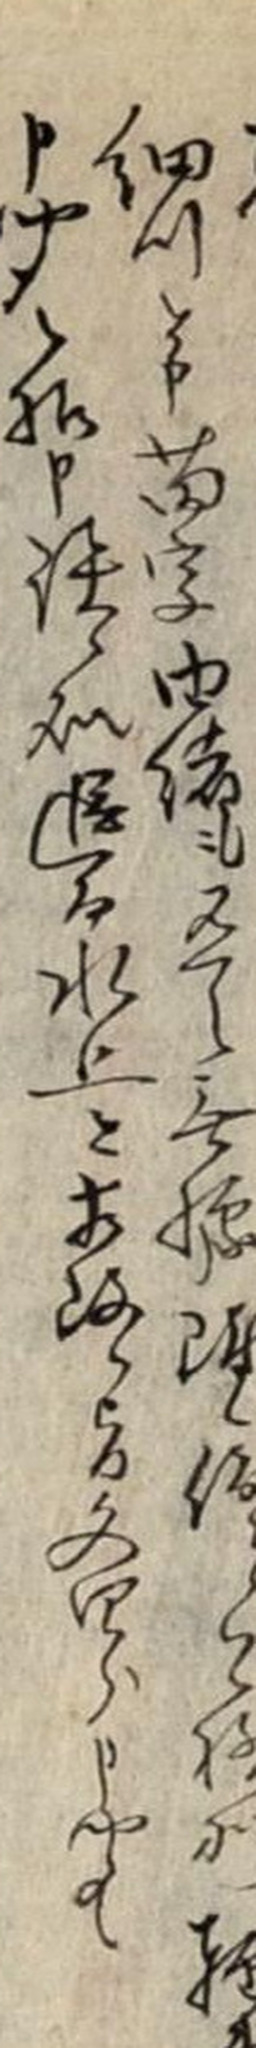申聞候様申談候処追而水上と相改候旨文四郎申聞候
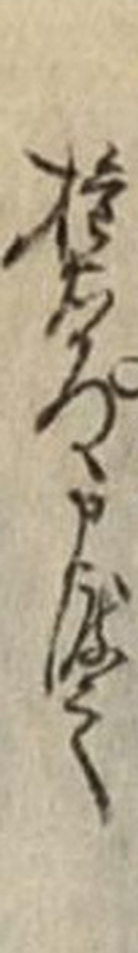権右衛門へ申渡之

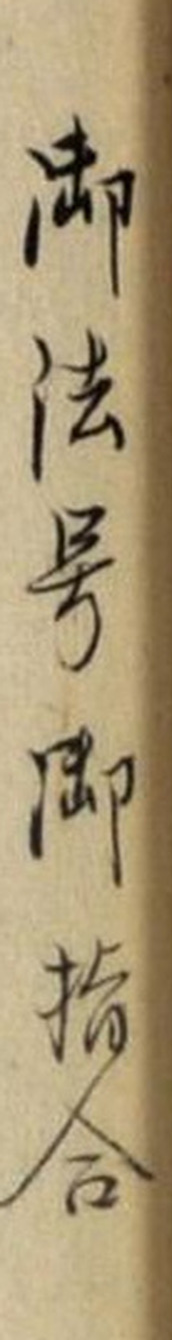御法号御指合
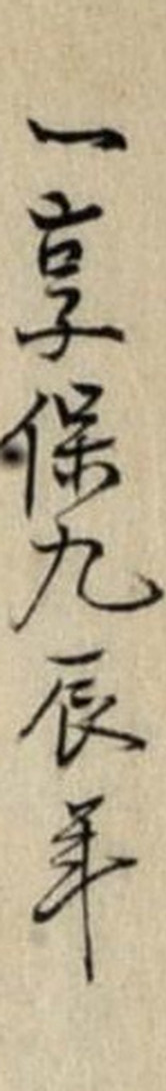一享保九辰年
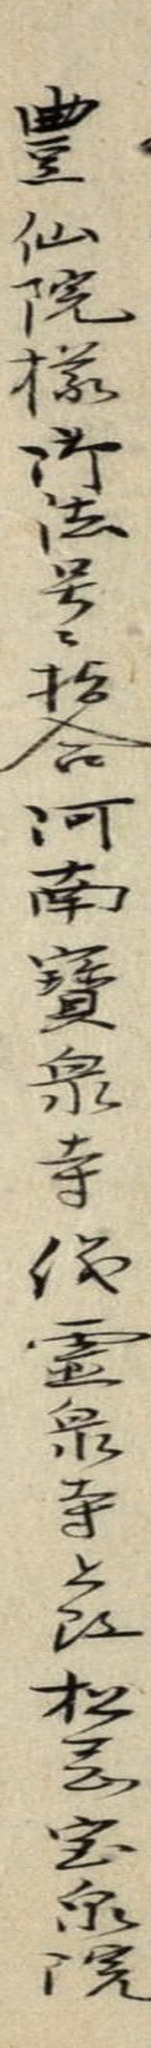豊仙院様御法号に指合河南宝泉寺儀霊泉寺と改松岡宝泉院
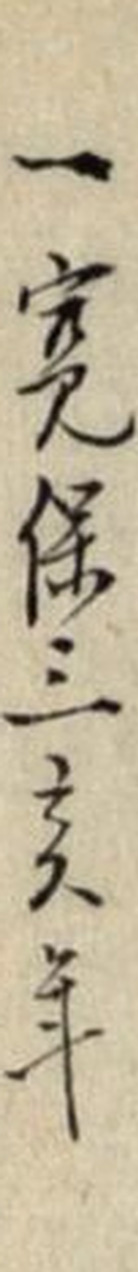一寛保三亥年
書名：蒐輯之部
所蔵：福井県文書館 Fukui Prefectural Archives
